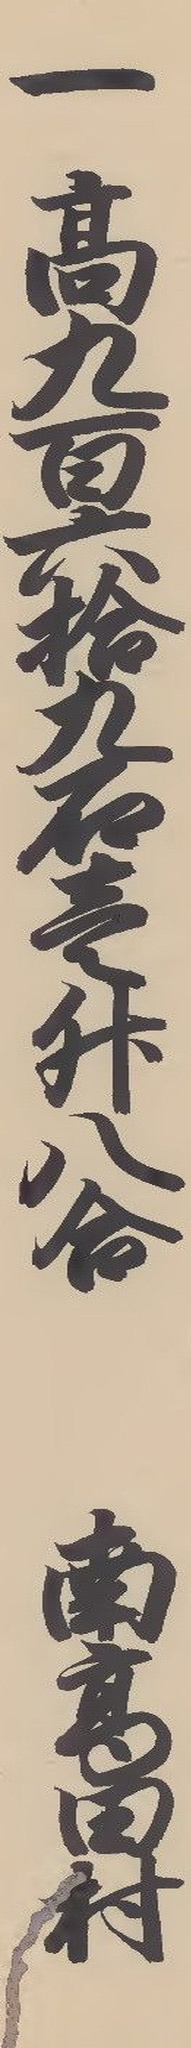一高九百六拾九石壱升八合南高田村
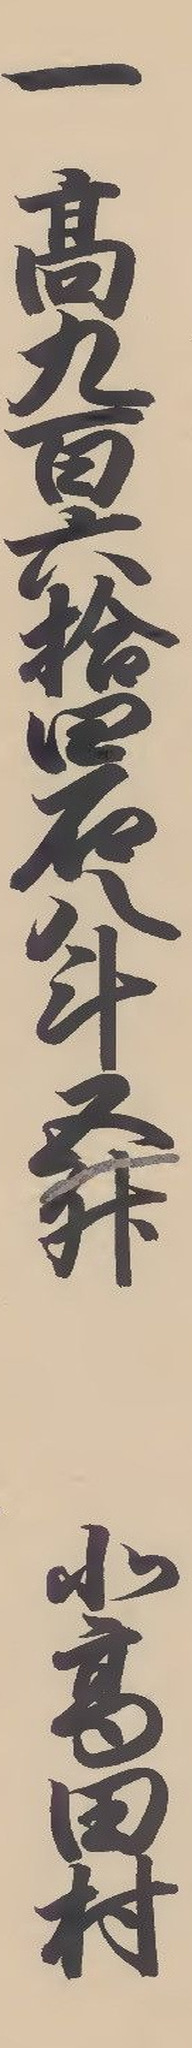一高九百六拾四石八斗五升北高田村

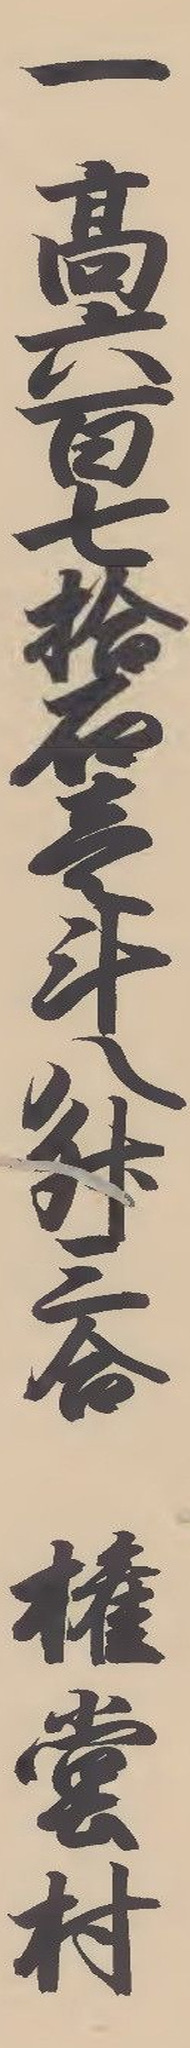一高六百七拾石壱斗八升三合権堂村
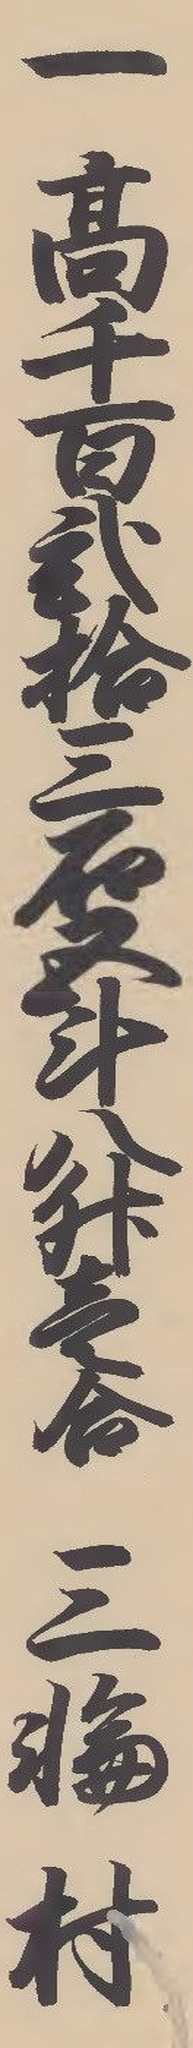一高千百弐拾三石五斗八升壱合三輪村
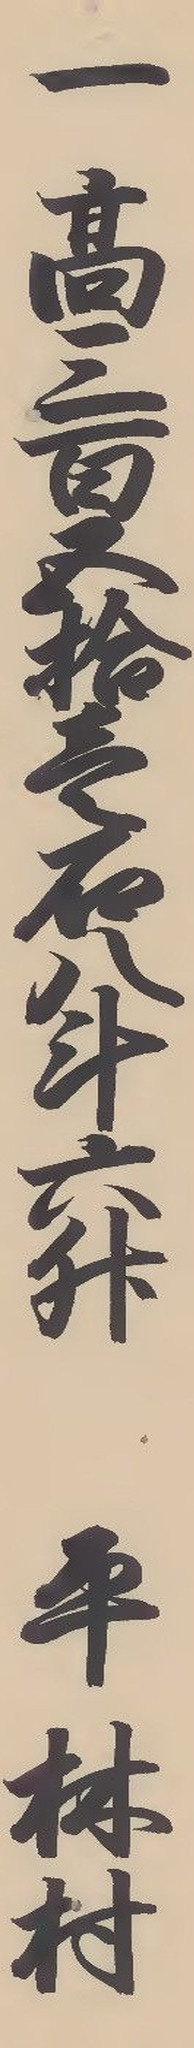一高三百五拾壱石八斗六升平林村
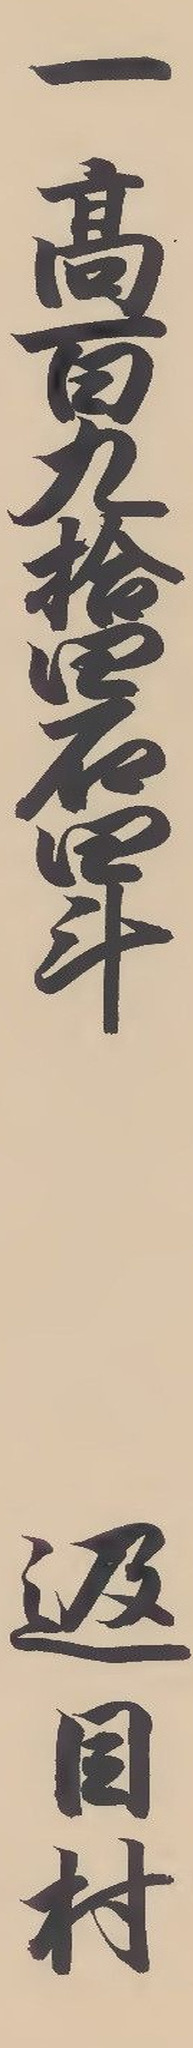一高百九拾四石四斗﨤目村
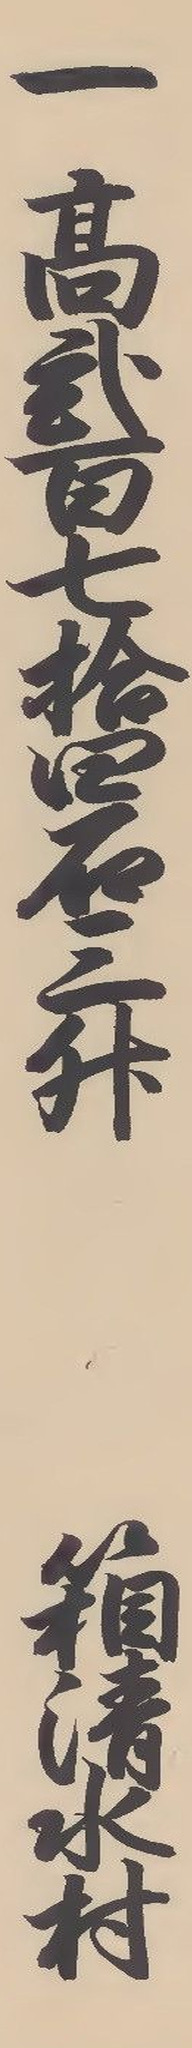一高弐百七拾四石三升箱清水村
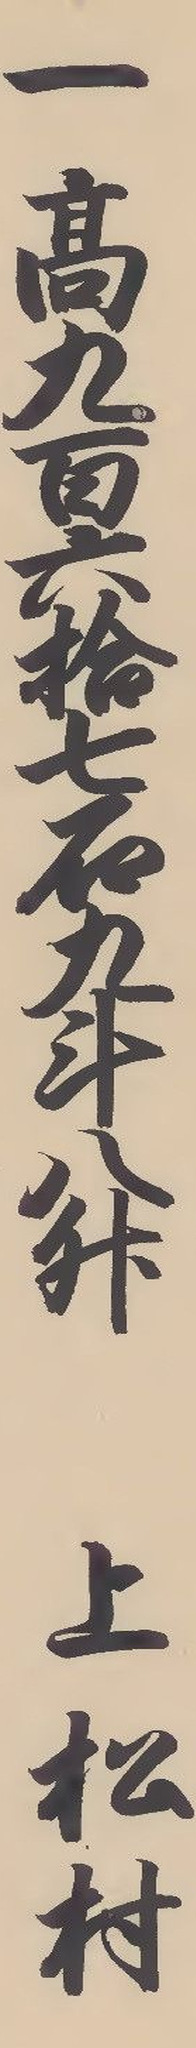一高九百六拾七石九斗八升上松村
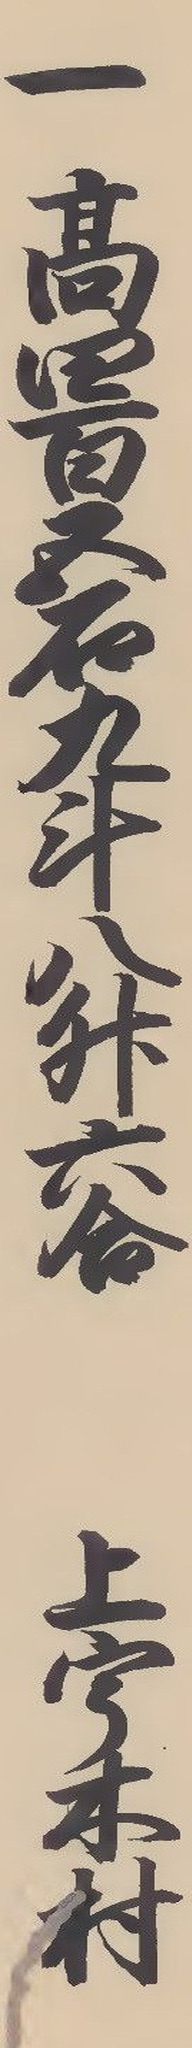一高四百五石九斗八升六合上宇木村
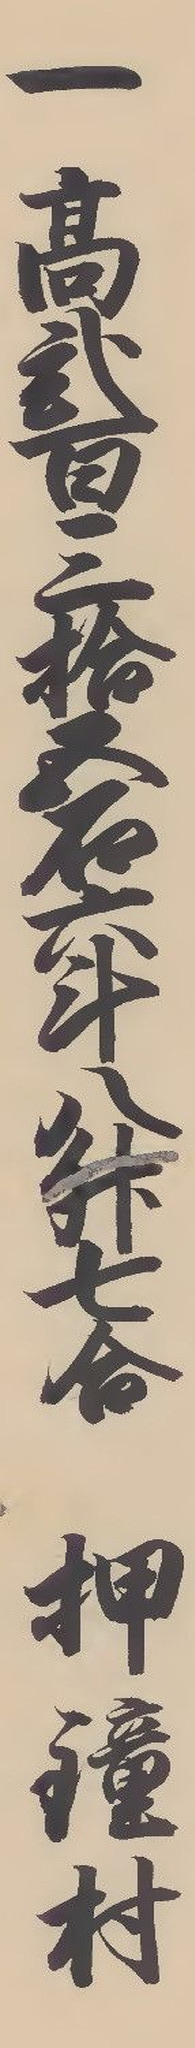一高弐百三拾五石六斗八升七合押鐘村

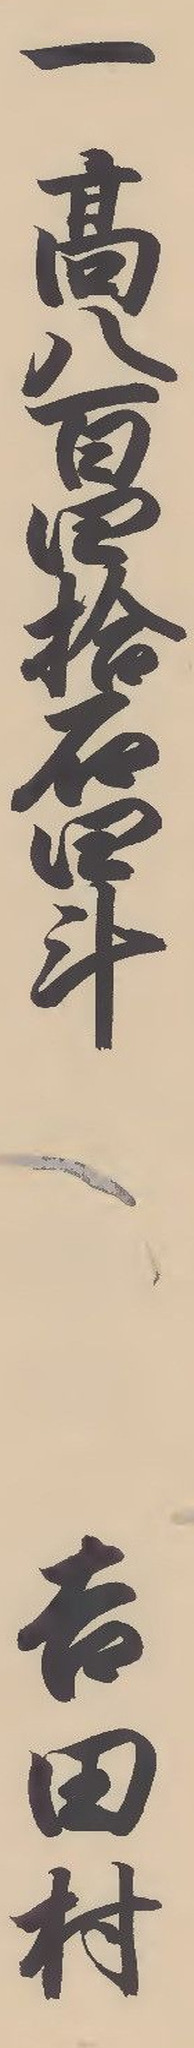一高八百四拾石四斗吉田村
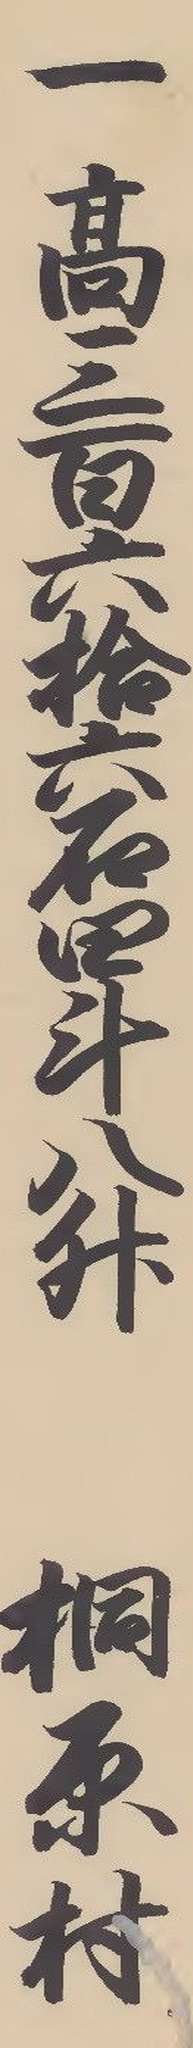一高三百六拾六石四斗八升桐原村
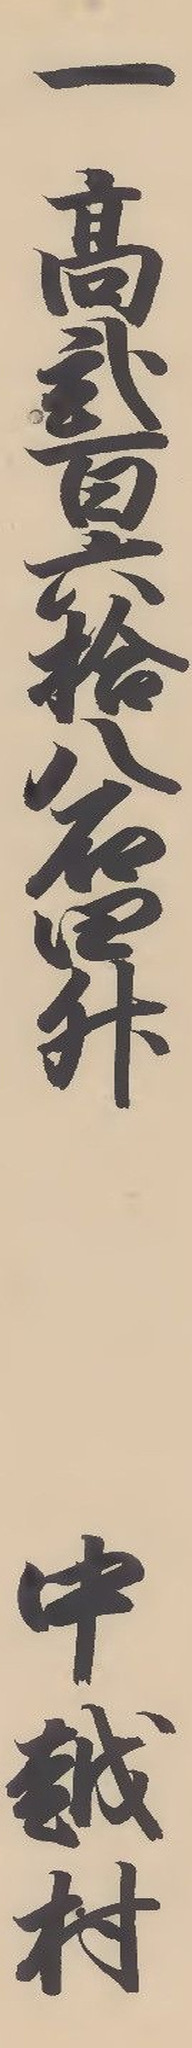一高弐百六拾八石四升中越村
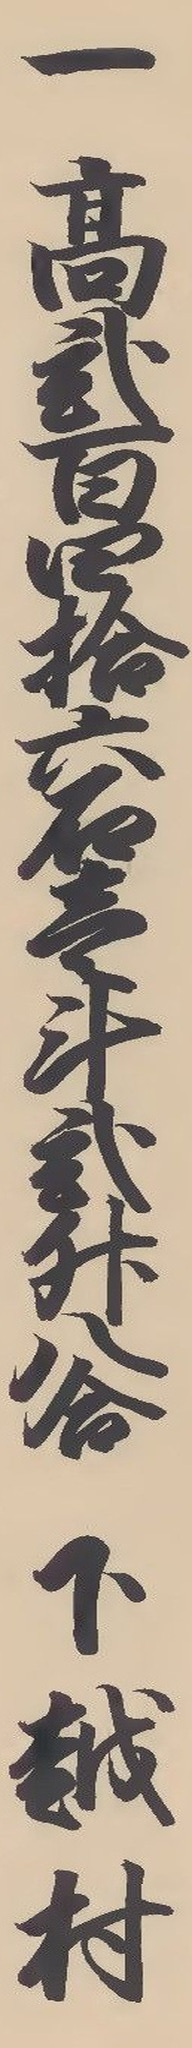一高弐百四拾六石壱斗弐升八合下越村
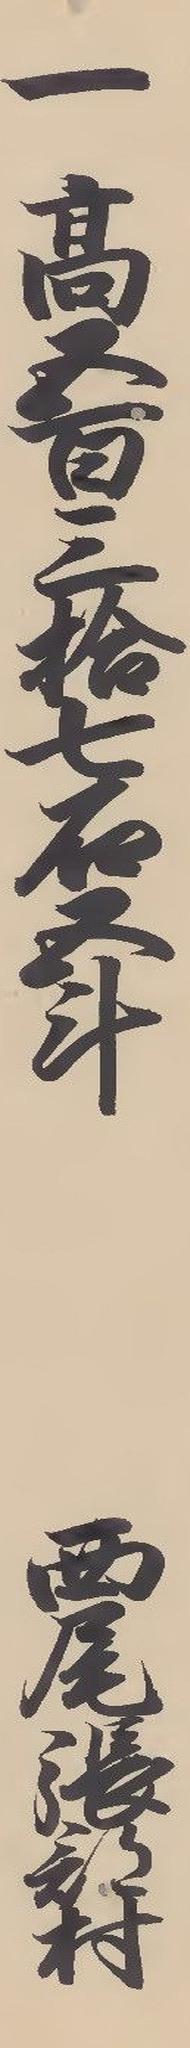一高五百三拾七石五斗西尾張部村
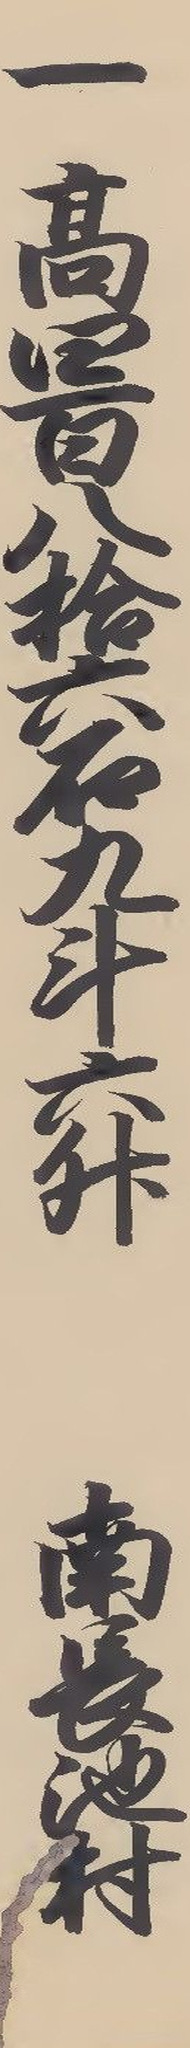一高四百八拾六石九斗六升南長池村
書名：信濃国郷帳
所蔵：国立公文書館 National Archives of Japan
